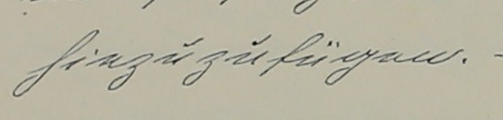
hinzuzufügen.
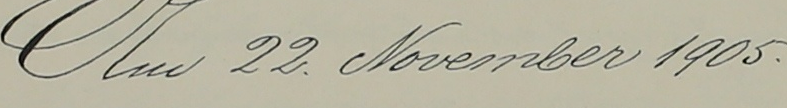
Am 22. November 1905.
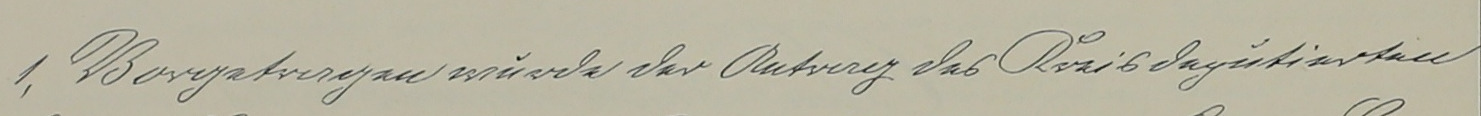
1. Vorgetragen wurde der Antrag des Kreisdeputierten
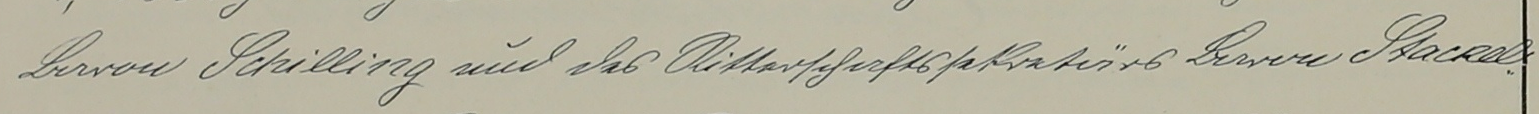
Baron Schilling und des Ritterschaftssekretärs Baron Stackel-
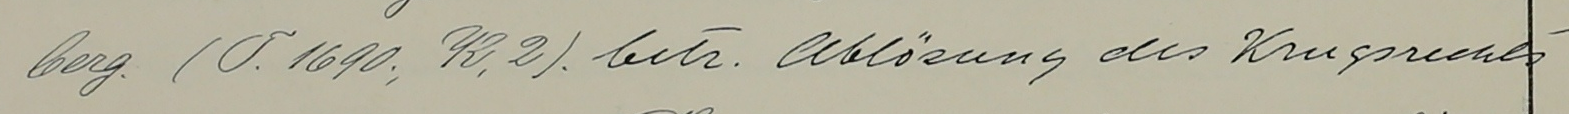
berg (T.1690; K.2) betr. Ablösung des Krugsrechts
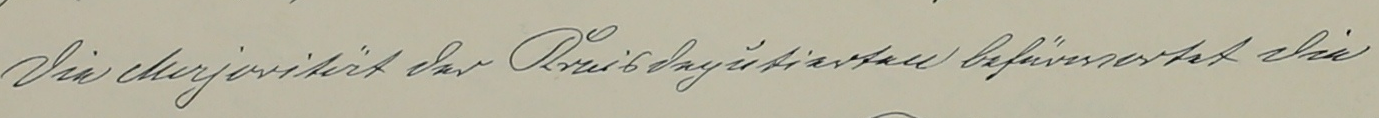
Die Majorität der Kreisdeputierten befürwortet die
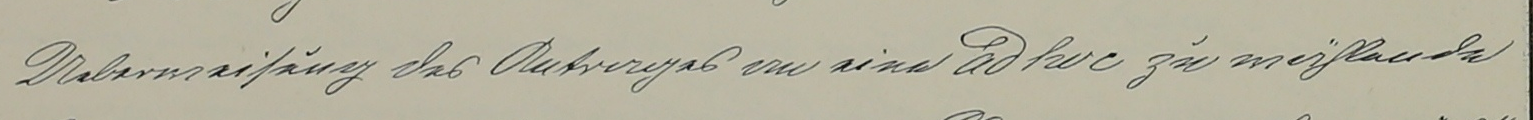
Ueberweisung des Antrages an eine ad hoc zu wählende
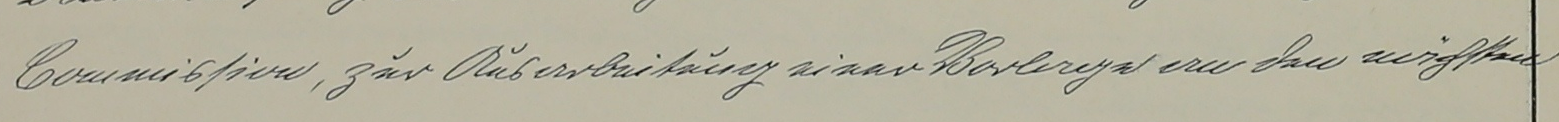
Commission, zur Ausarbeitung einer Vorlage an den nächsten
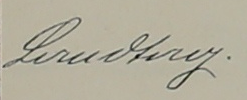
Landtag.
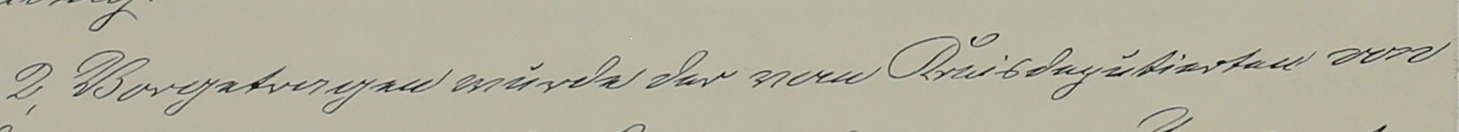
2. Vorgetragen wurde der vom Kreisdeputierten von
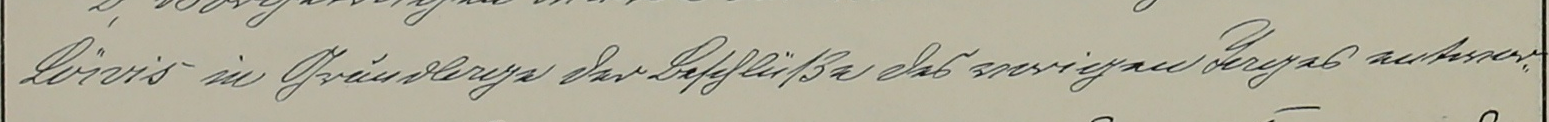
Löwis in Grundlage der Beschlüße des vorigen Tages entwor-
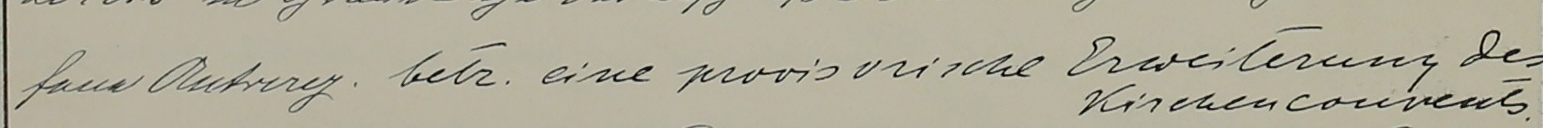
fene Antrag. betr. eine provisorische Erweiterung des
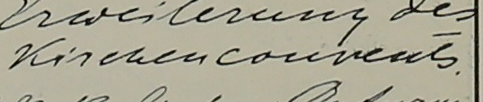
Kirchenconvents
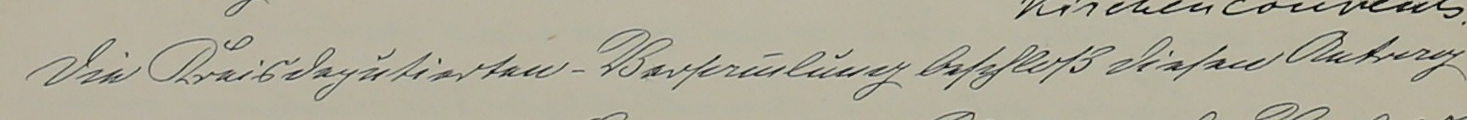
Die Kreisdeputierten-Versammlung beschloß diesen Antrag
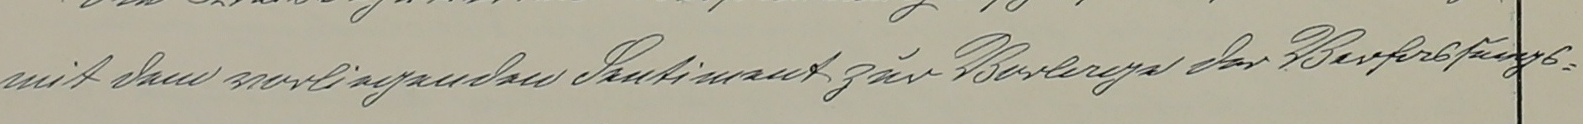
mit dem vorliegenden Sentiment zur Vorlage der Verfassungs-
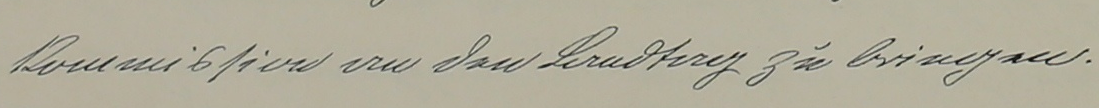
kommission an den Landtag zu bringen.
